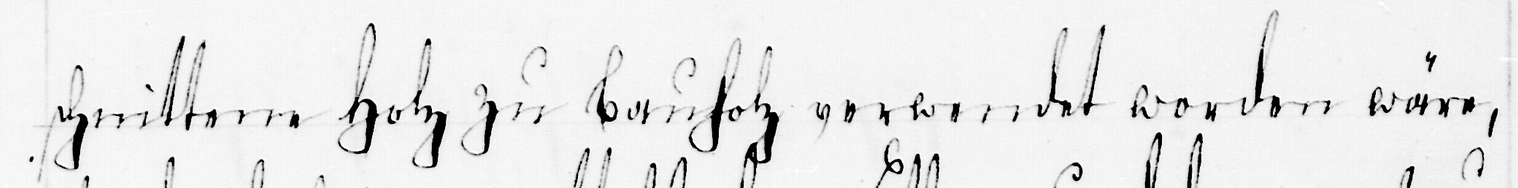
schnittene Holz zu Bauholz verwendet worden wäre,
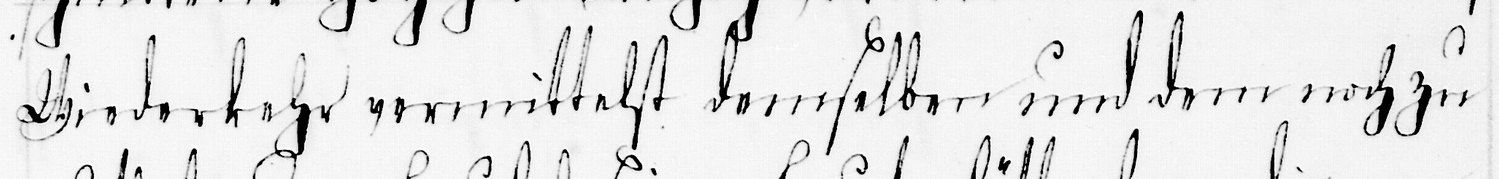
Wiederkehr vermittelst demselben und dem noch zu
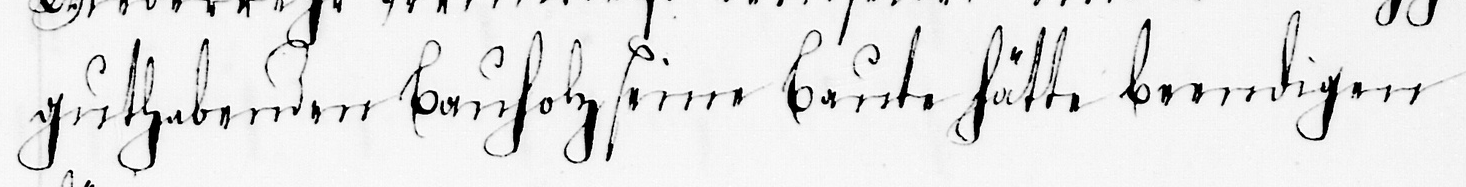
guthabenden Bauholz seine Baute hätte beendigen
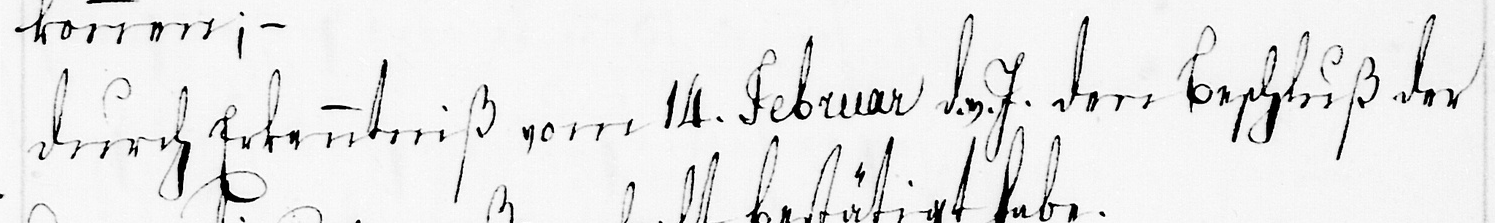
durch Erkenntniß vom 14. Februar d. v. J. den Beschluß der
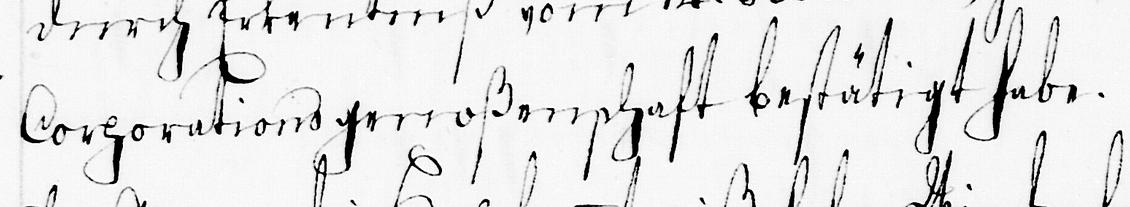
Corporationsgenoßenschaft bestätigt habe.
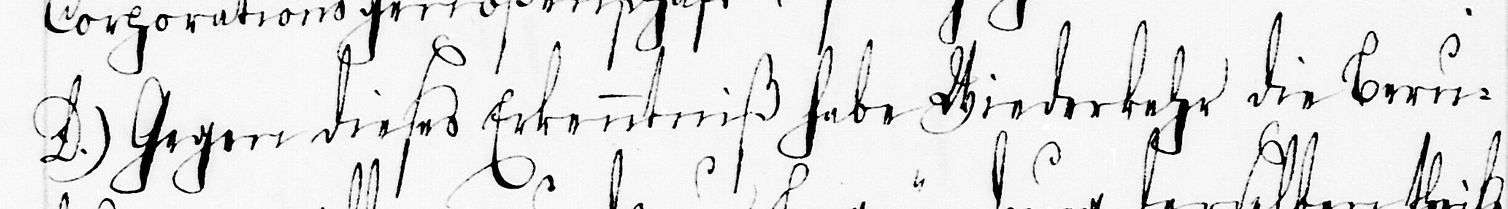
D.) Gegen dieses Erkenntniß habe Wiederkehr die Beru¬
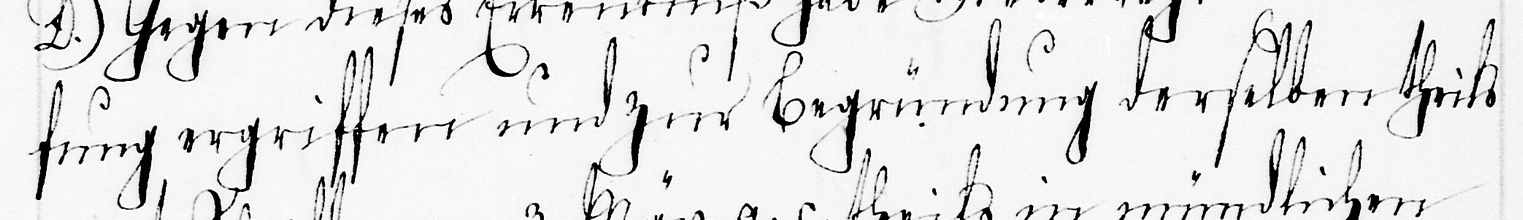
fung ergriffen und zur Begründung derselben theils
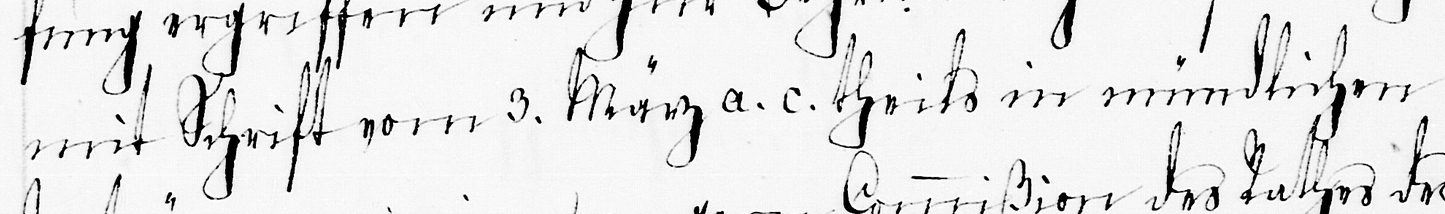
mit Schrift vom 3. März a. c. theils in mündlichen
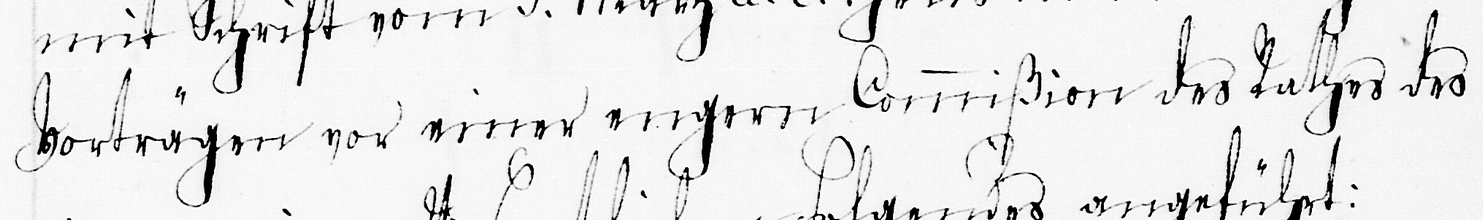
Vorträgen vor einer engern Commißion des Rathes des
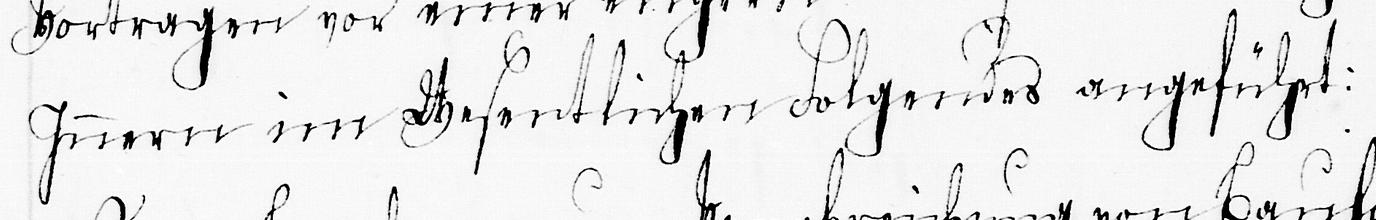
Innern im Wesentlichen Folgendes angeführt:
